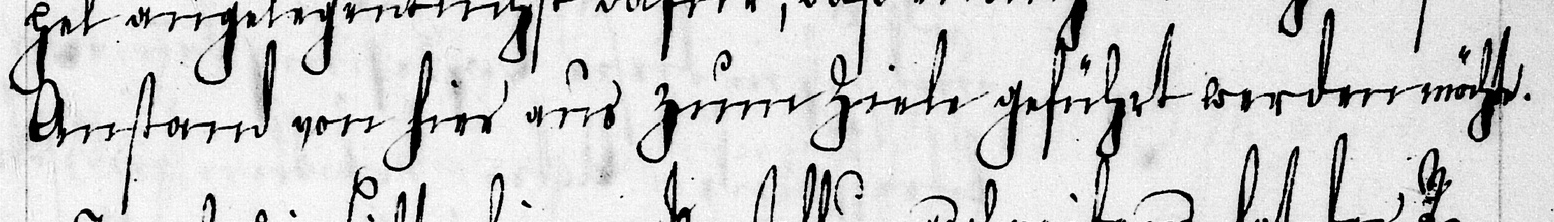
Anstand von hier aus zum Ziele geführt werden möchte.
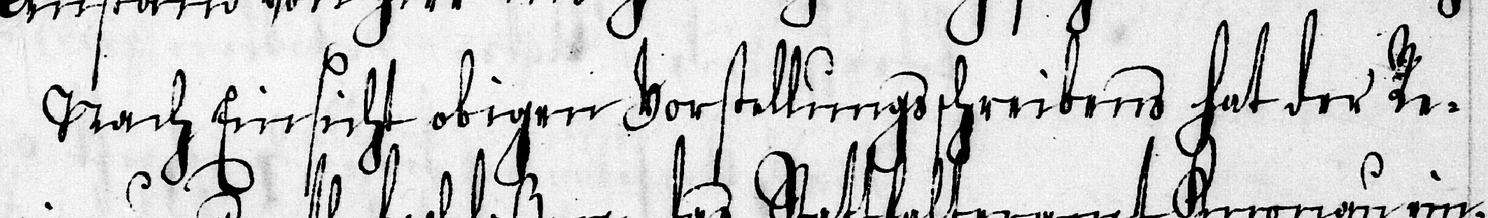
Nach Einsicht obigen Vorstellungsschreibens hat der Re¬
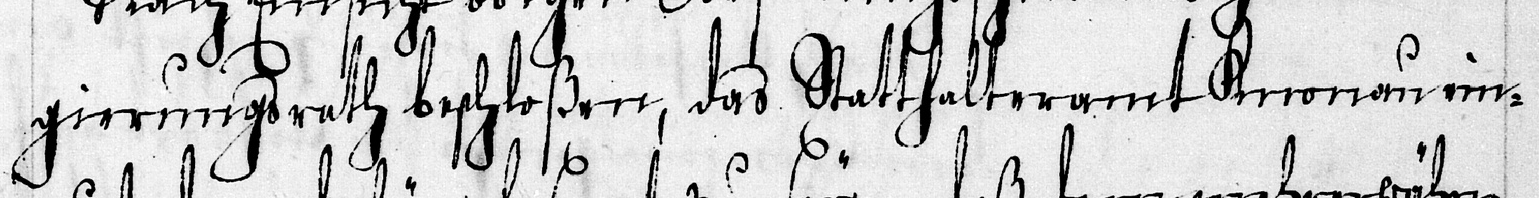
gierungsrath beschloßen, das Statthalteramt Knonau ein¬
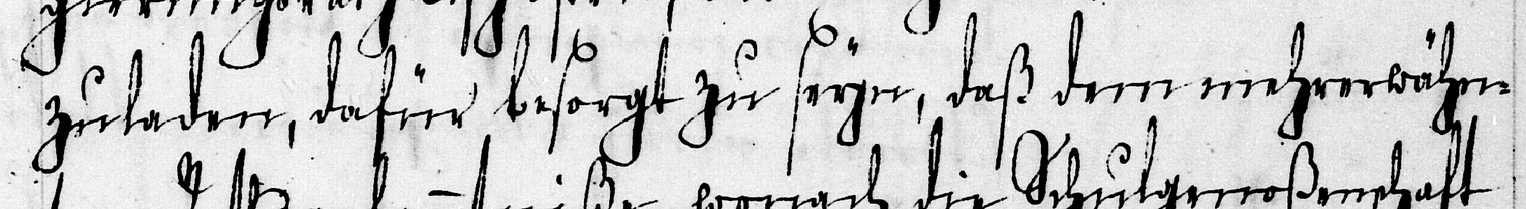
zuladen, dafür besorgt zu seyn, daß dem mehrerwähn¬
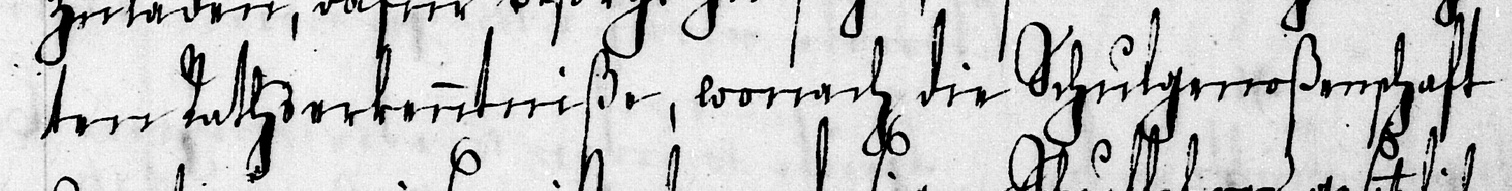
ten Rathserkenntniße, wonach die Schulgenoßenschaft
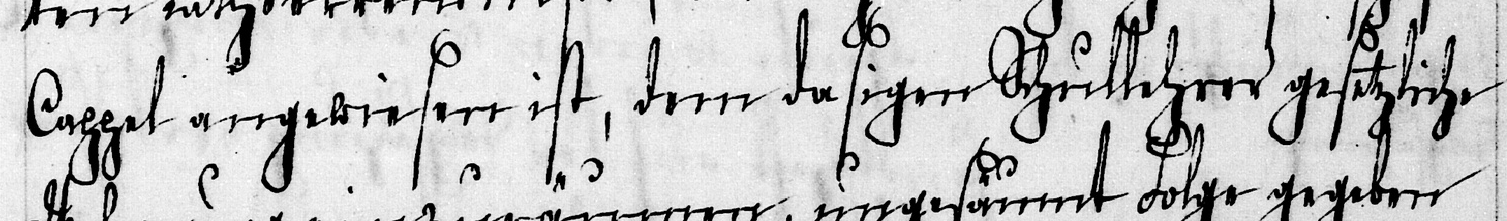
Cappel angewiesen ist, dem dasigen Schullehrer gesetzli¬
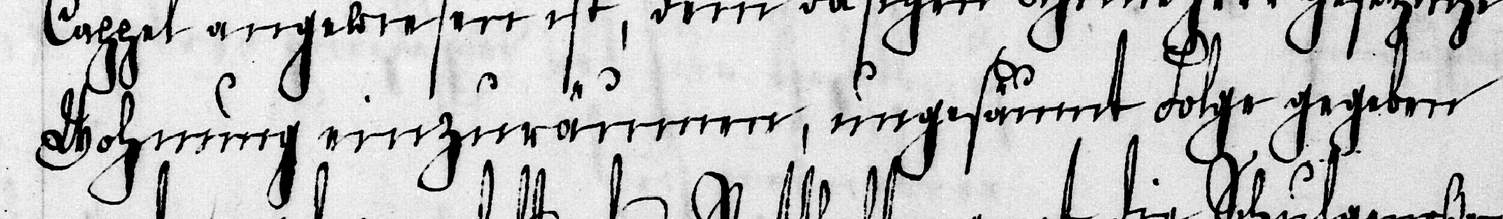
Wohnung einzuräumen, ungesäumt Folge gegeben
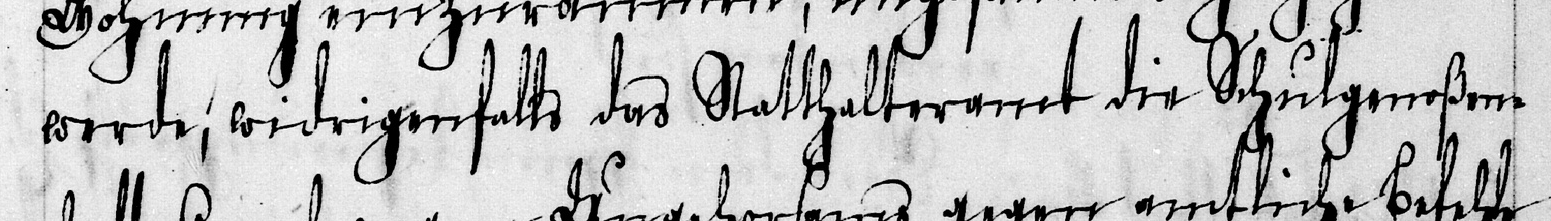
werde, widrigenfalls das Statthalteramt die Schulgenoßen¬
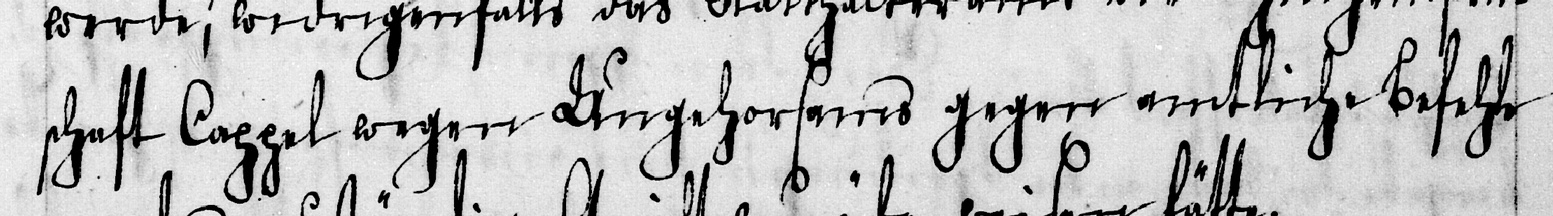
schaft Cappel wegen Ungehorsams gegen amtliche Befehle
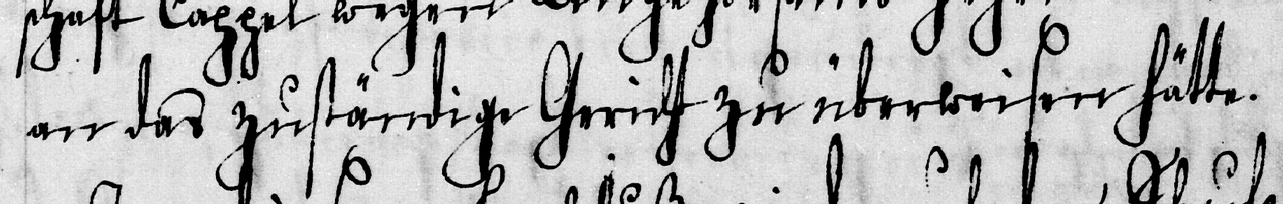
an das zuständige Gericht zu überweisen hätte.
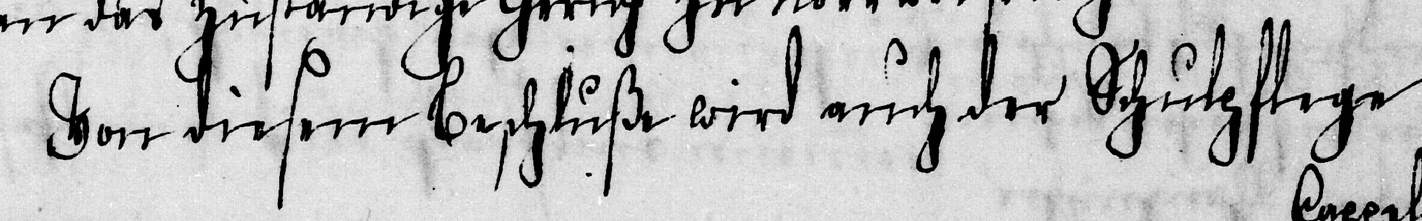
Von diesem Beschluße wird auch der Schulpflege
